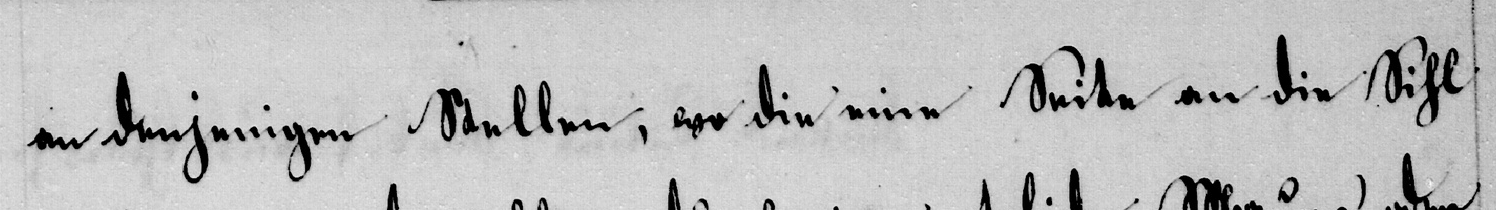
an denjenigen Stellen, wo die eine Seite an die Sihl
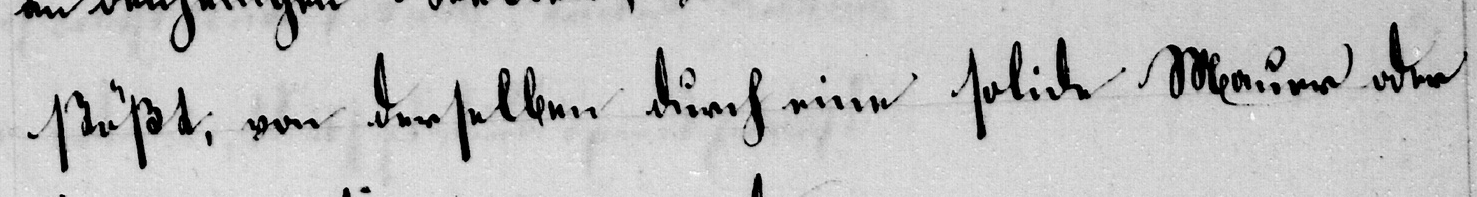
stößt, von denselben durch eine solide Mauer oder
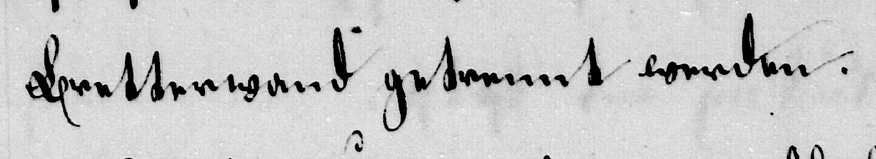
Bretterwand getrennt werden.
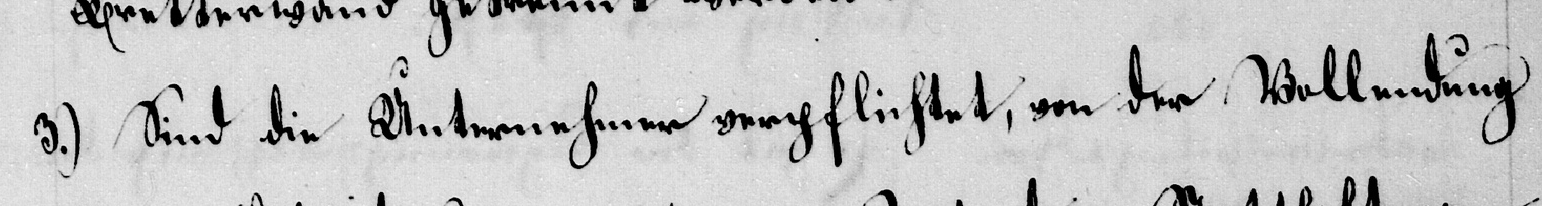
3.) Sind die Unternehmer verpflichtet, vor der Vollendung
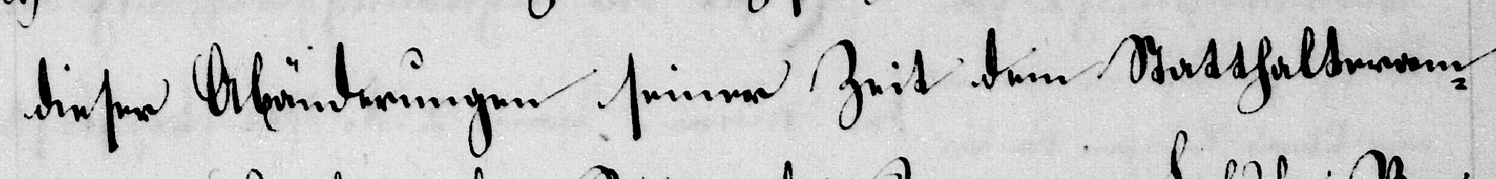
dieser Abänderungen seiner Zeit dem Statthalteram¬
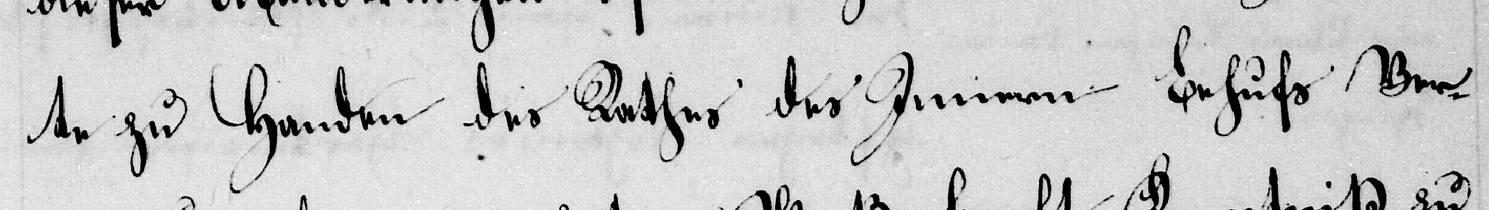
te zu Handen des Rathes des Innern Behufs Ver¬
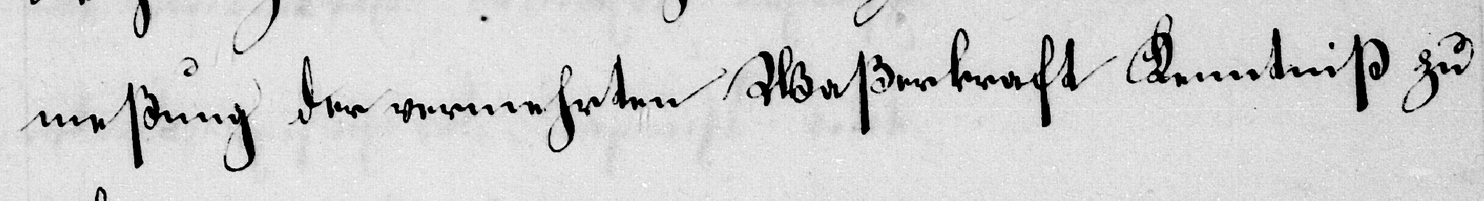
meßung der vermehrten Waßerkraft Kenntniß zu
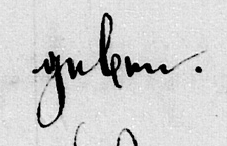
geben.
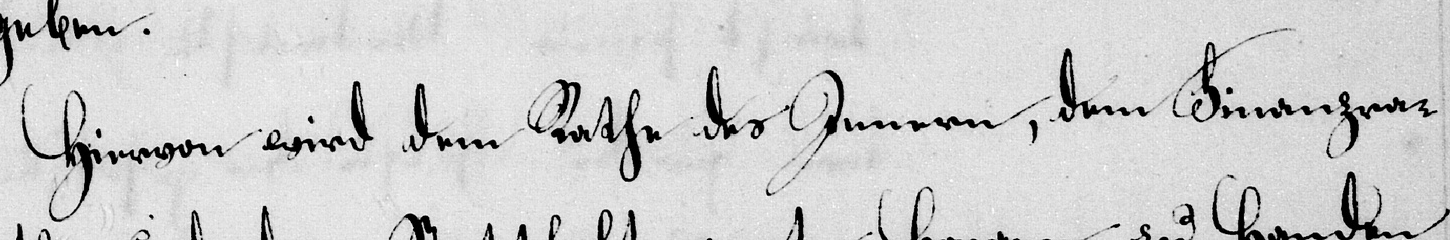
Hievon wird dem Rathe des Innern, dem Finanzra¬
